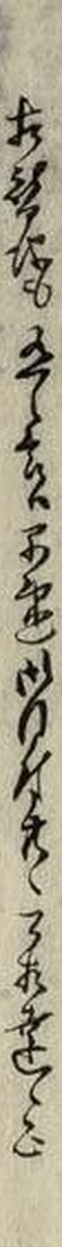相替候儀も有之節は早速御目付共へ可相達候以上
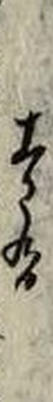十一月九日
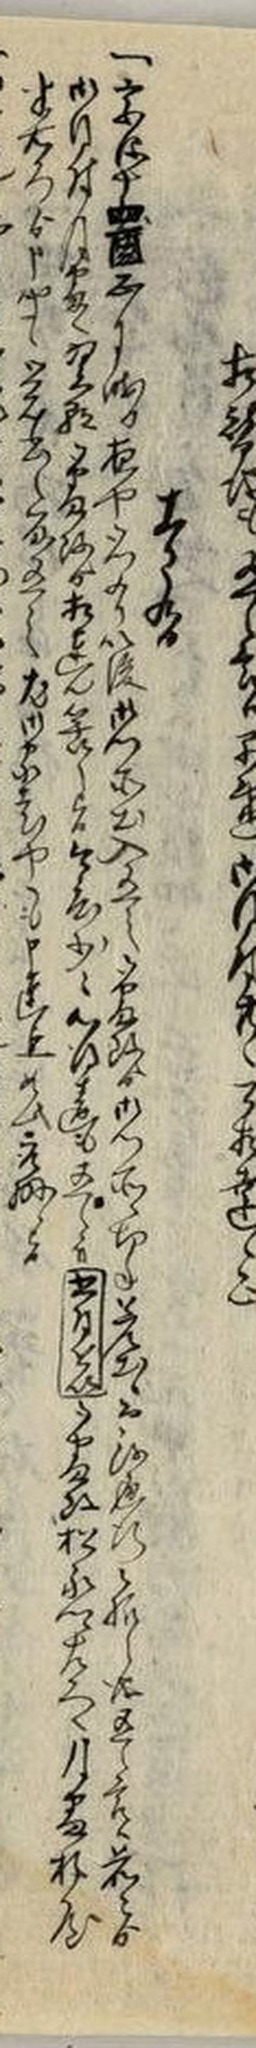一享保十四酉正月晦日夜中御門〆り以後御門所出入有之御番改ゟ御門所へ切手差出候而致通行候様之儀有之節ハ前々ゟ
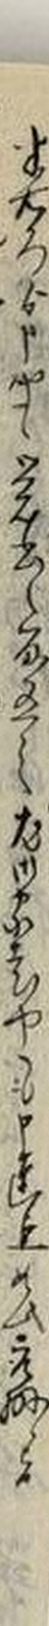半右衛門ゟ申聞候覚書之留有之尤御家老中へも申達候上如此取扱候旨
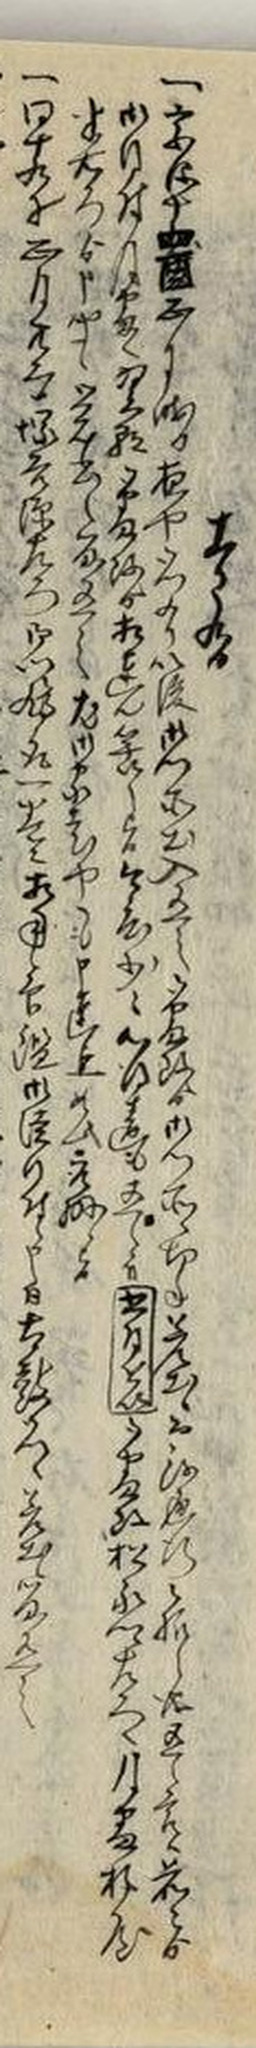御目付月番へ翌朝御番改ゟ相達候筈之旨今度少々心得違有之に付書付を以御番改松永郷左衛門へ月番栃屋
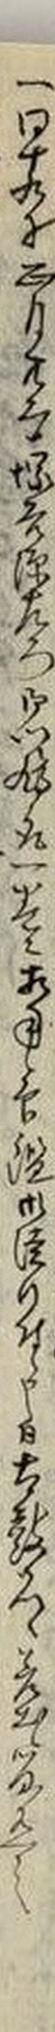一同十九寅正月廿二日塚谷源左衛門御門鳩取一巻に相用候印鑑御徒目付へ申付太鼓御門へ差出留有之
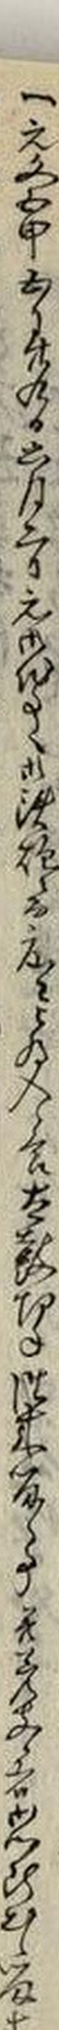一元文五申五月廿九日六月二日元御作事へ御鉄砲に而度々被為入候節太鼓切手往来留候事并差支候者御門断出候留等有之
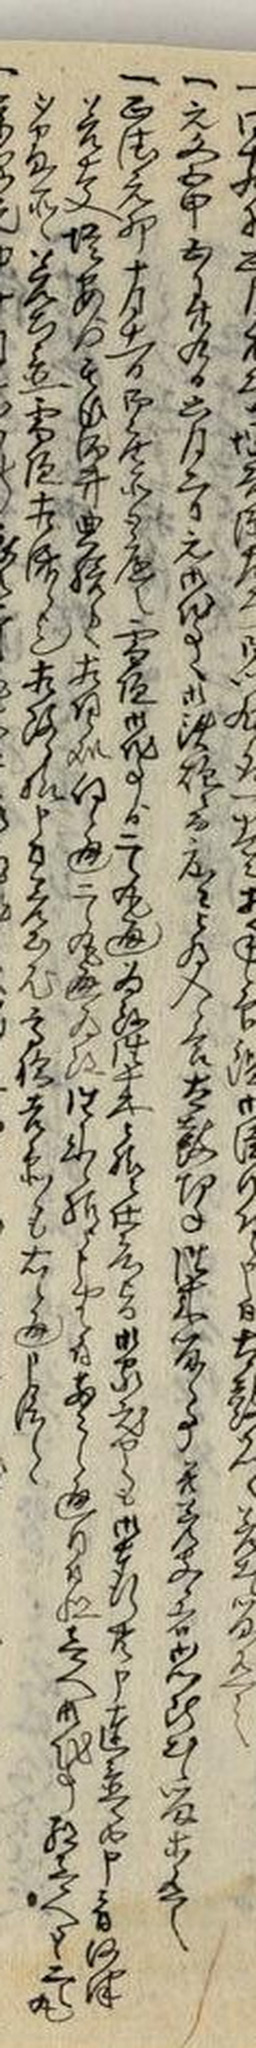正徳元卯十月十一日御座所御庭之雪垣御作事ゟ二之丸通為致往来候様に仕度旨御家老中へも御奉行共申達置候由申ニ付河津
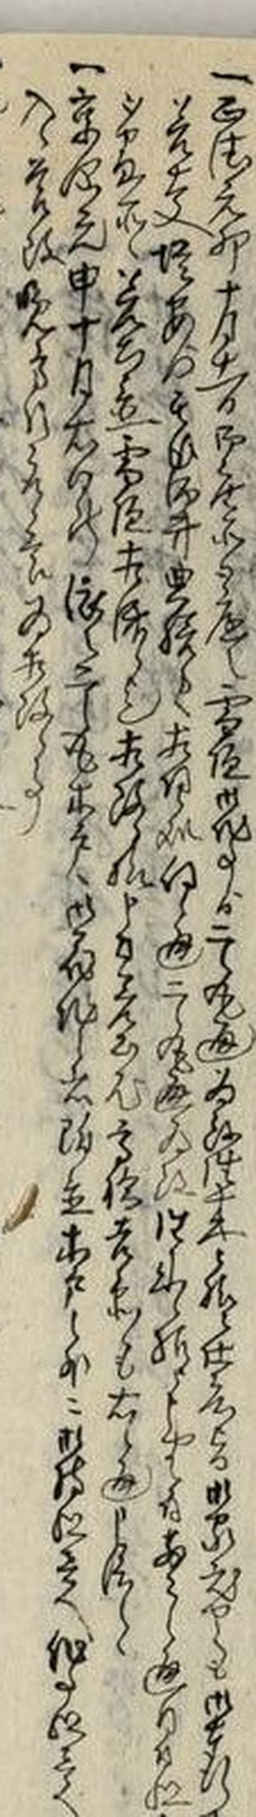御番所へ差出置雪垣相済候迄相改候様申付差出尤高橋吉兵衛へも右之通申渡之
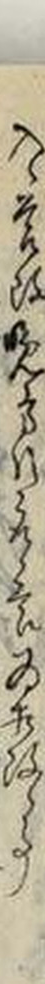入候節改晩方引取候節為相改候事
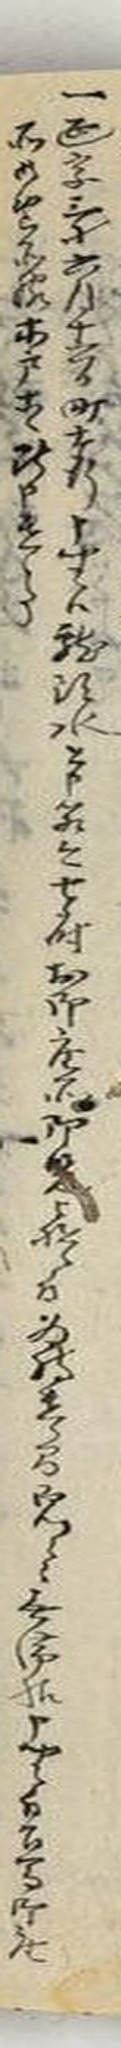一延享三寅六月十六日町奉行申聞候は竜頭水と申箱を七時於御座所御覧被遊候に付為持遣候間御門〳〵無滞候様申聞候に付下馬御座
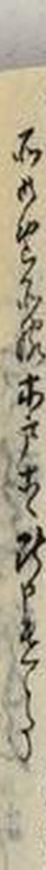所御台所脇木戸等へ断申遣候事
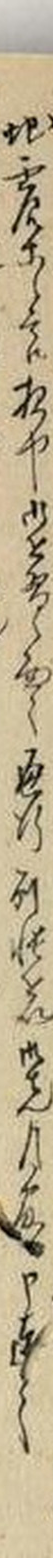地震等之節夜中御近習之面々通行別帳を以御先月番へ申達之
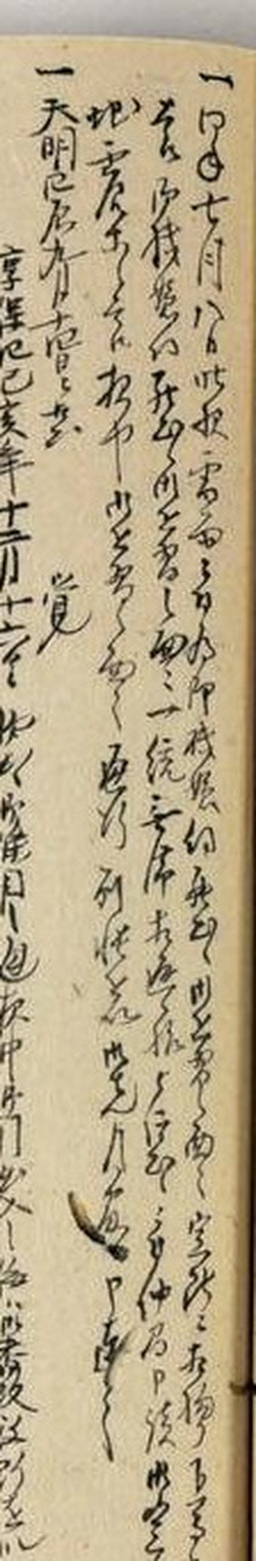地震等之節夜中御近習之面々通行別帳を以御先月番へ申達之
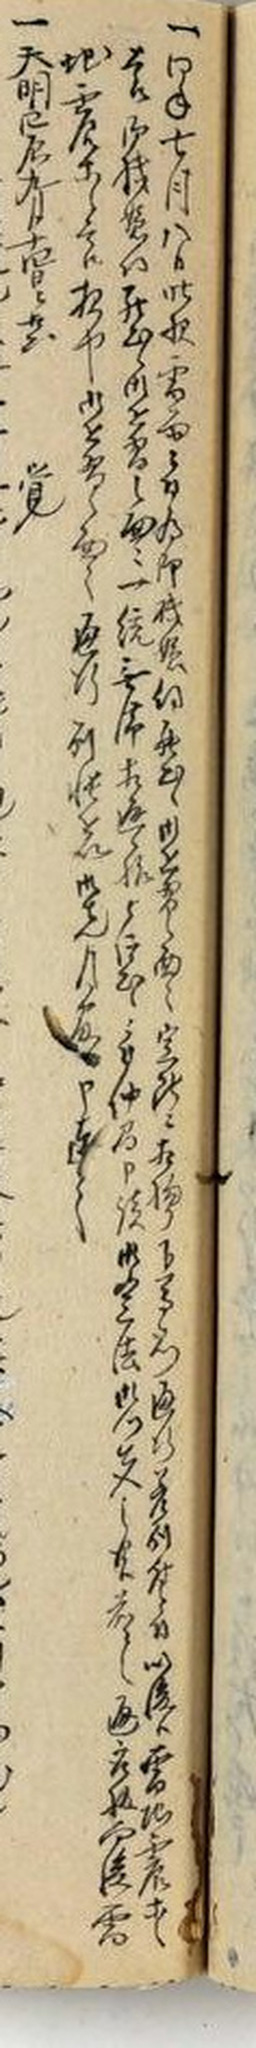節御機嫌伺罷出候御近習之面々一統無滞相通候様被仰出候に付仲間申談御定法御門出入之儀前々之通取扱向後雷
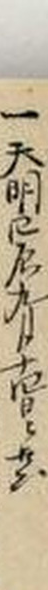一天明四辰九月十四日被仰出覚
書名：御門御櫓之部
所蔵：福井県文書館 Fukui Prefectural Archives
